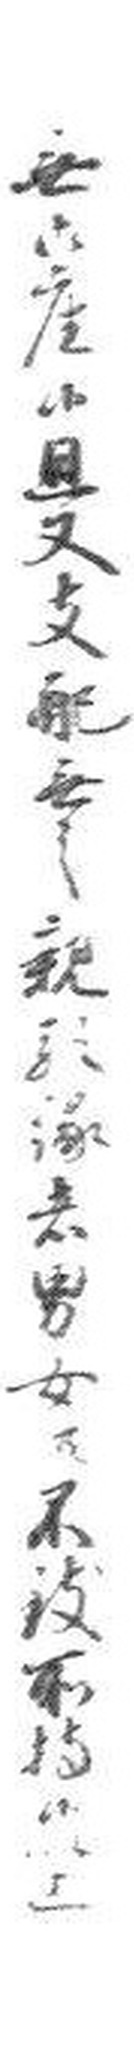無御座候且又支配無之親類縁者男女共不致所持候以
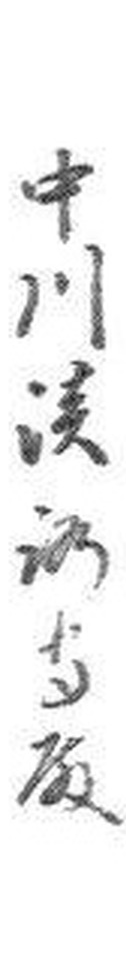中川淡路守殿
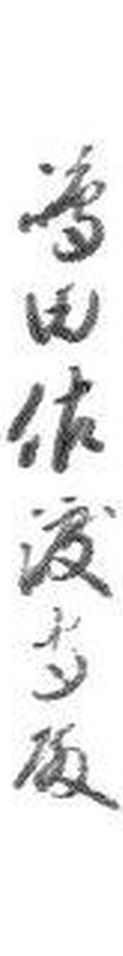嶋田佐渡守殿
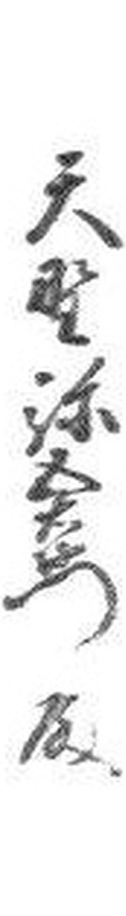天野弥五右衛門殿

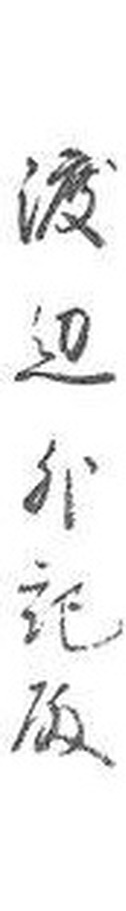渡辺外記殿
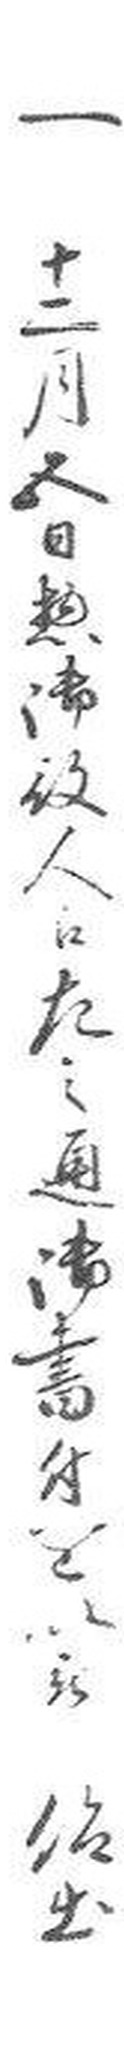一十二月五日惣御役人江左之通御書付を以被仰出
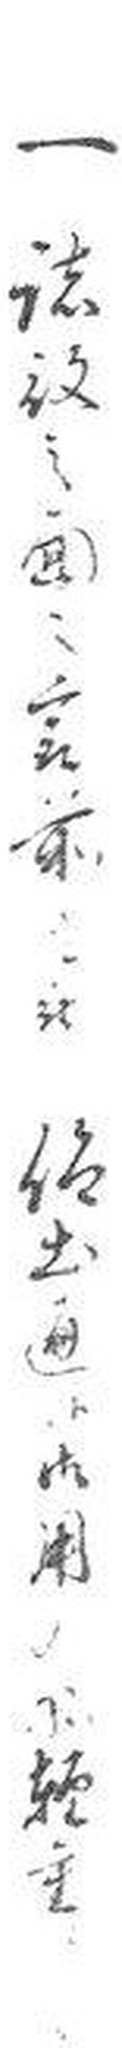一諸役之面々最前も被仰出通候御用之品軽重
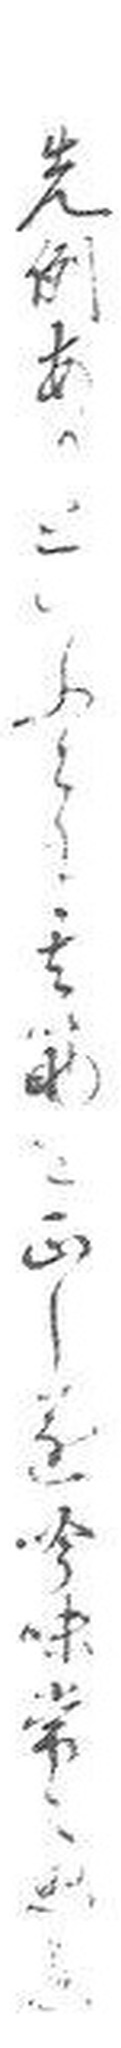先例ありといふとも其筋を正し遂吟味常々思慮
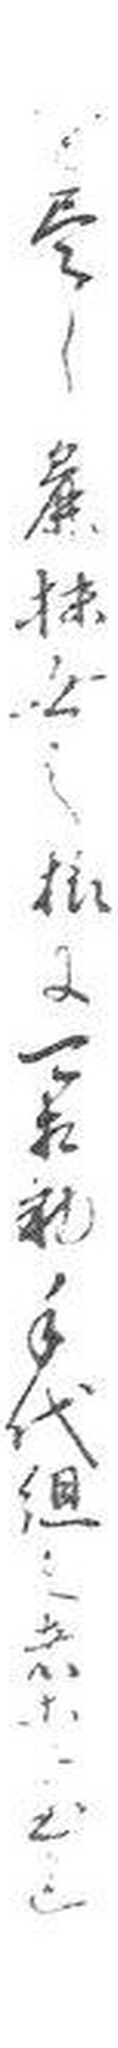を尽し麁末無之様に可相勤手代組之者等ニ至迄
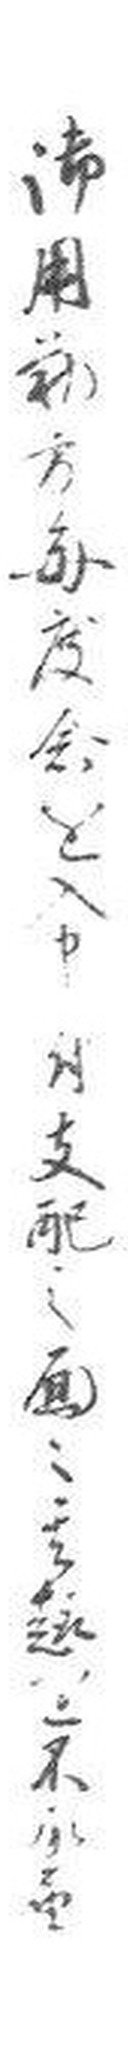御用勤方毎度念を入申付支配之面々其趣を不承届
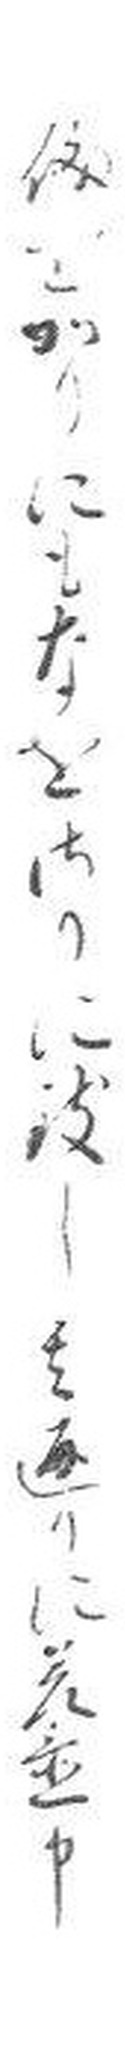儀をかりにもなおさりに致し其通りに差置申
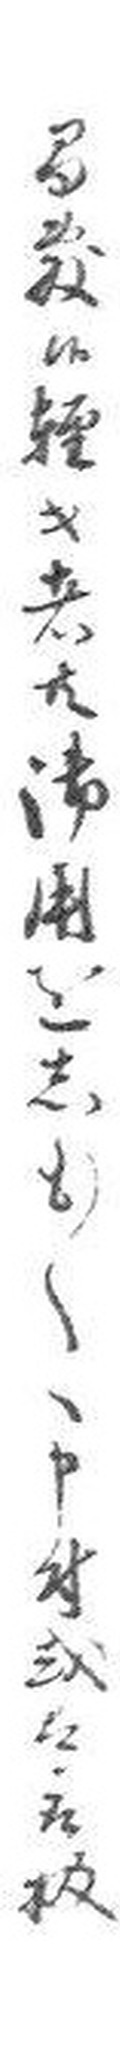間敷候軽キ者共御用をしも〳〵へ申付或は取扱
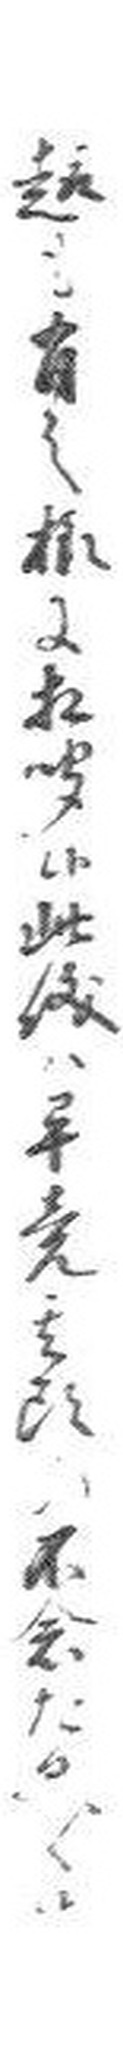趣も有之様に相聞候此儀ハ畢竟其頭の不念たる
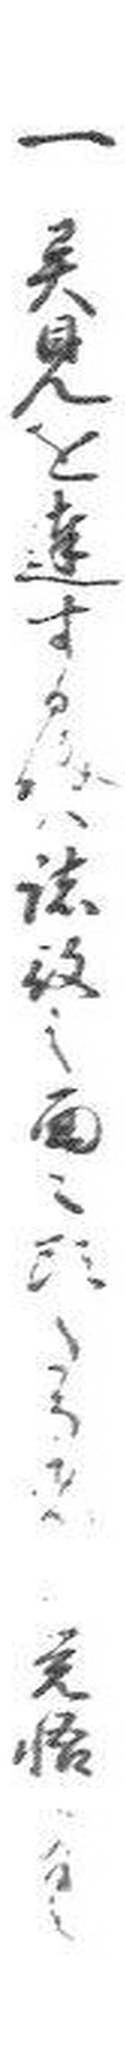一異見を達する儀ハ諸役之面々頭たる者の覚悟有之
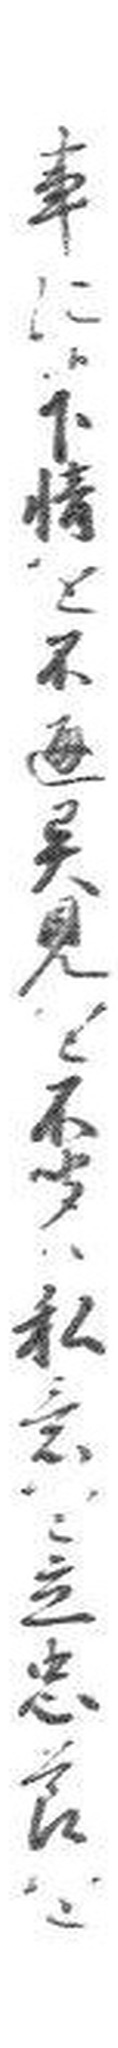事に候下情を不通異見を不聞ハ私意を立忠節を
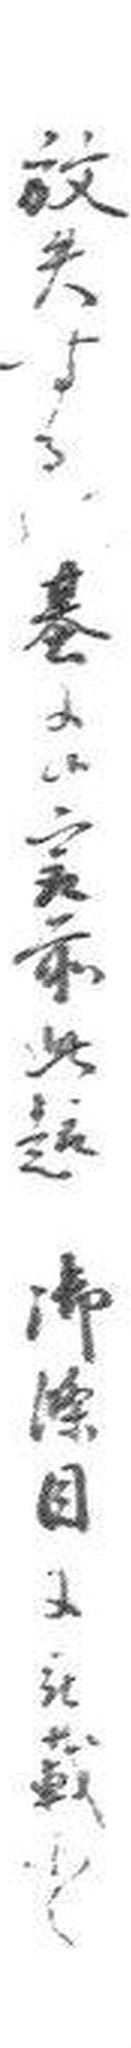放失するの基に候最前此趣御条目に被載と
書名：家譜 二十九 吉邦公 従正徳二年到正徳三年
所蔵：福井県文書館 Fukui Prefectural Archives
